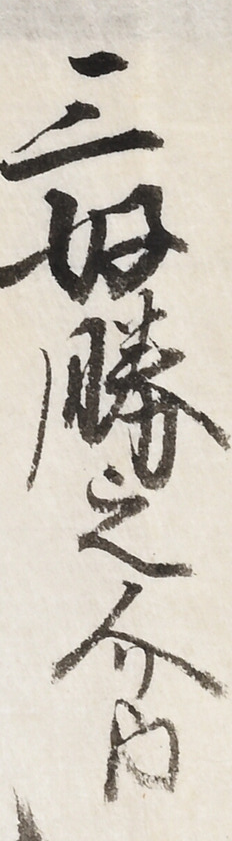三好勝之介内
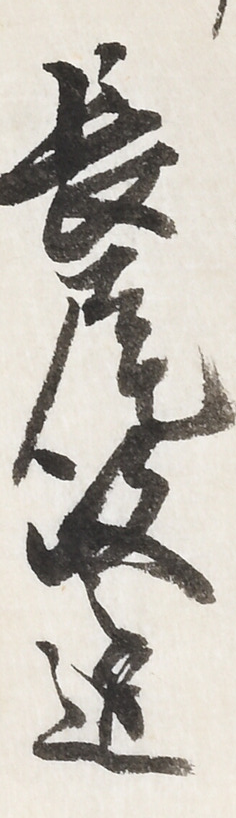長尾政之進
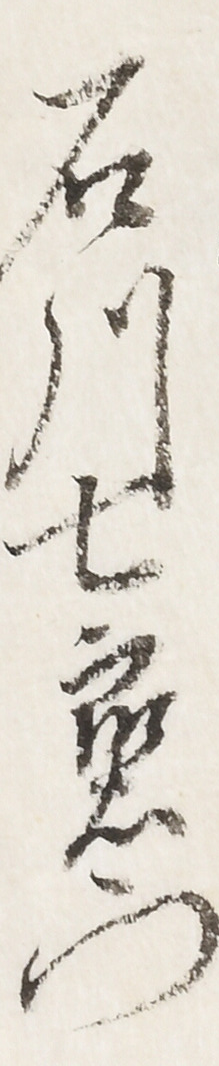石川七郎右衛門
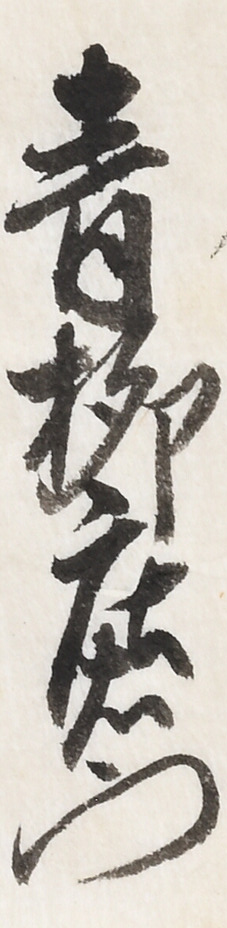青柳庄右衛門
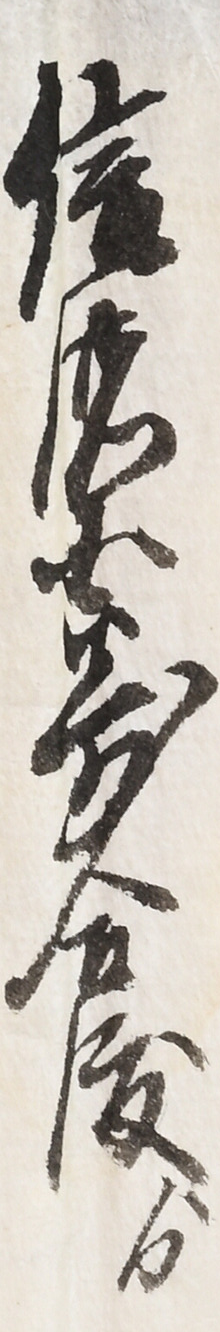信濃国寄合渡より
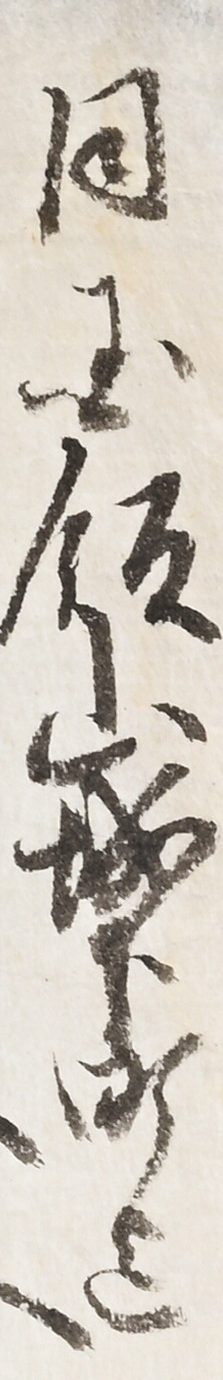同国飯山城下町迄
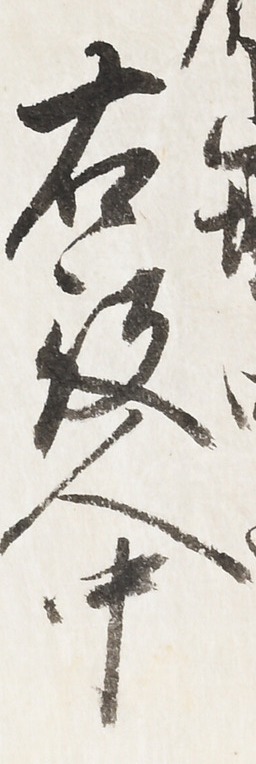右役人中
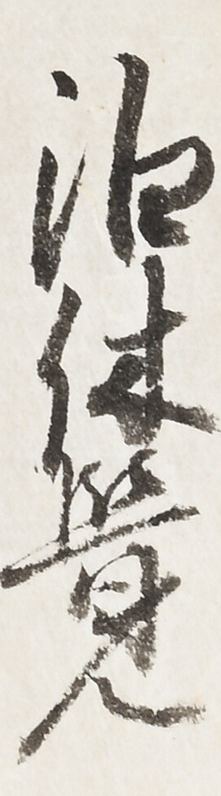泊休覚
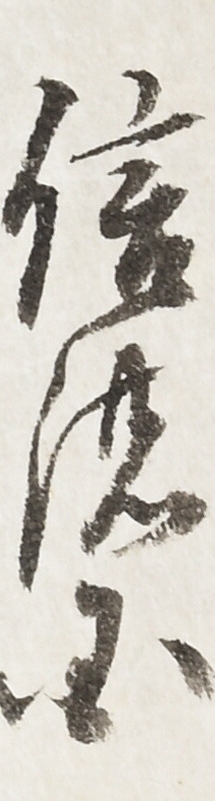信濃国
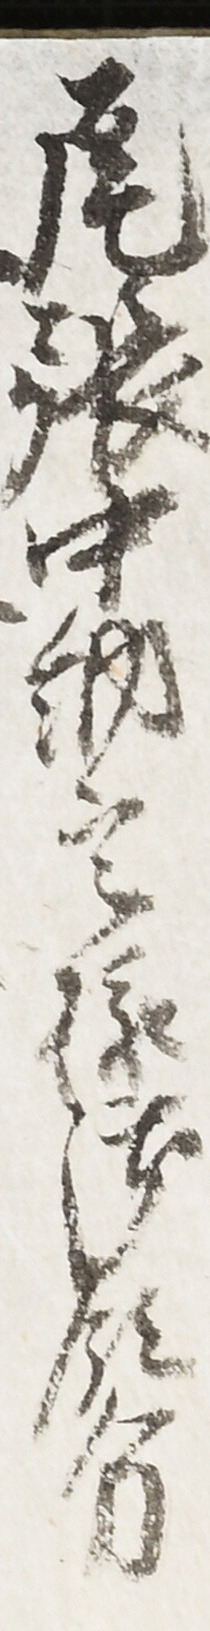尾張中納言様御領分
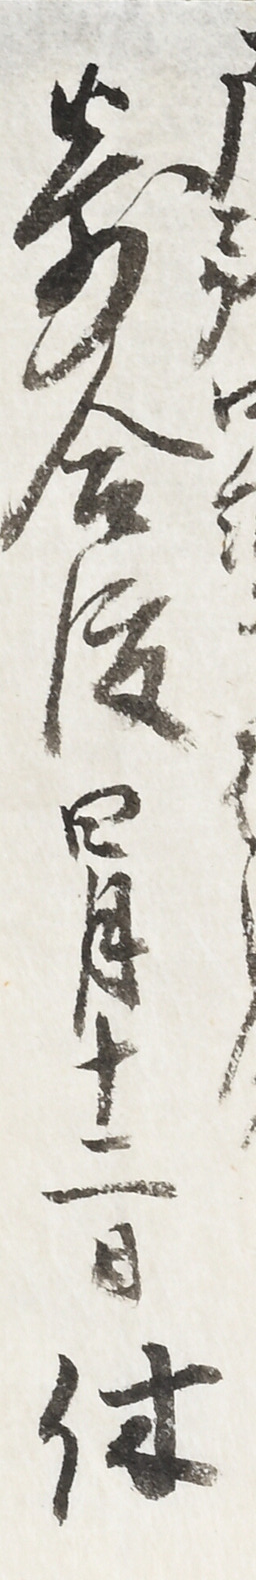寄合渡四月十二日休
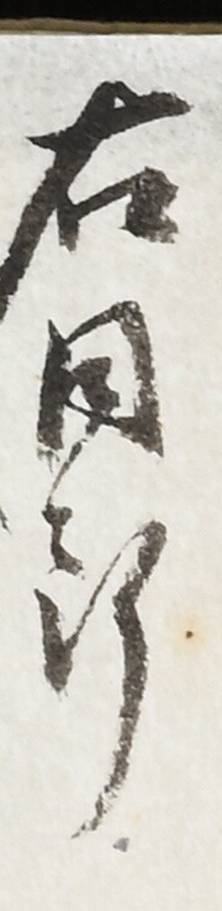右同断
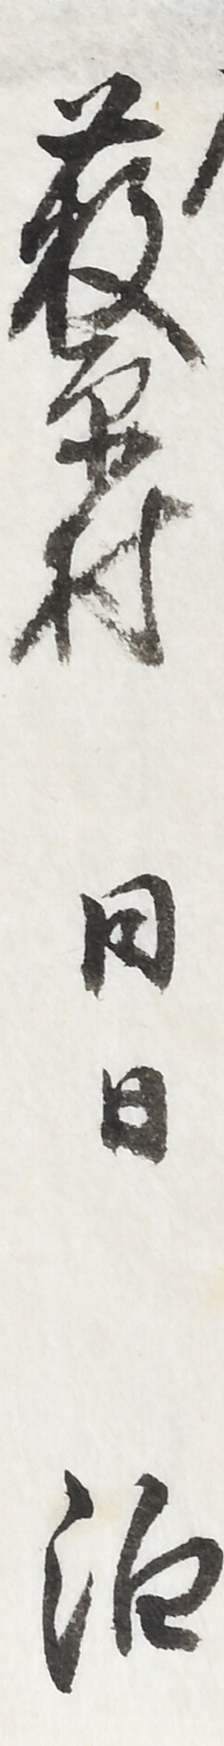藪原村月日泊
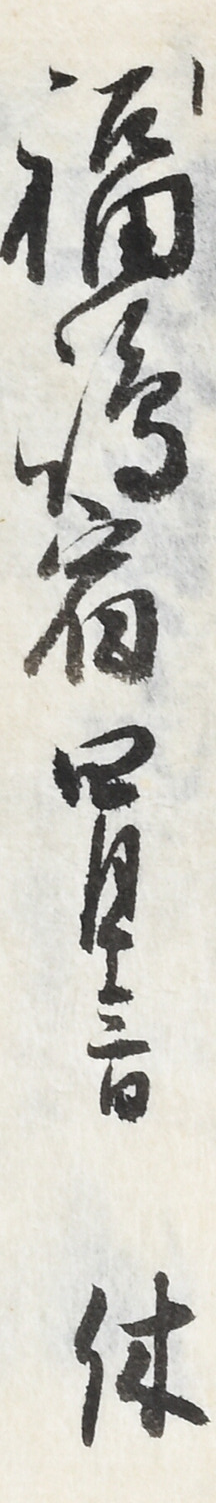寄合渡四月十二日休

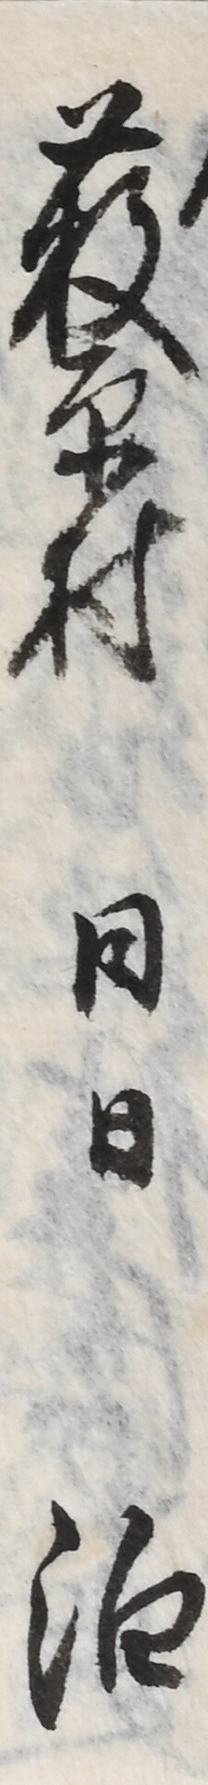野尻村同日泊
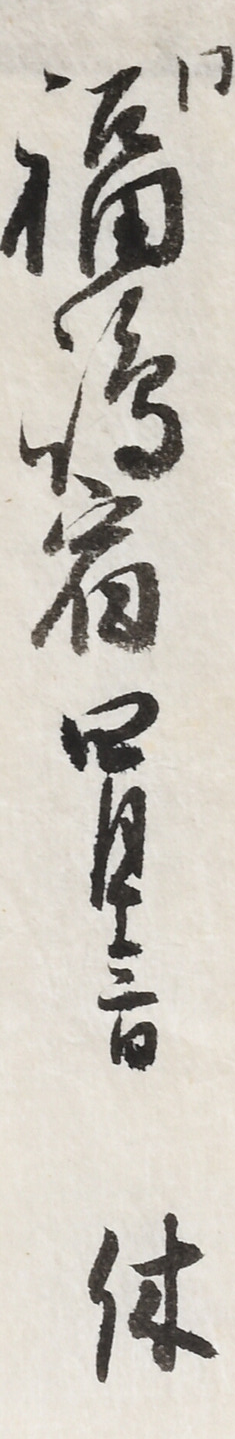福島宿四月十三日休
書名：御巡見様御先觸之写
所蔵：伊那市立高遠町図書館・合同会社AMANE
